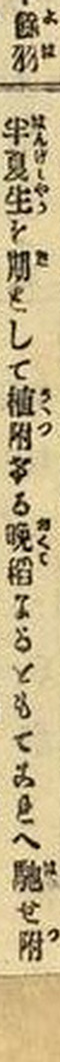半夏生を期として植附ける晩稻なるともてこれへ馳せ附
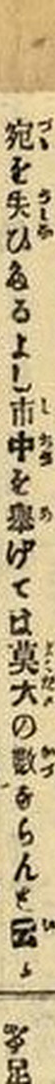宛失ひたるよし市中を擧げては莫大の數ならんと云ゝ
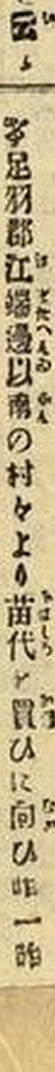け足羽郡江端邊以南の村々より苗代を買ひに向ひ昨一昨
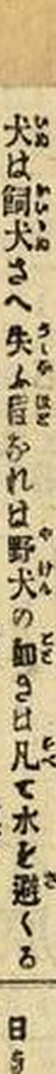犬は飼犬さへ失ふ程なれば野犬の如きは凡て水を避くる
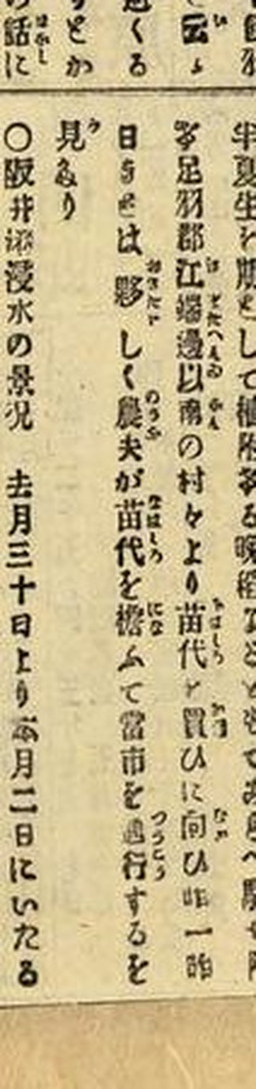日なとは夥しく農夫が苗代を檐ふて當市を通行するを
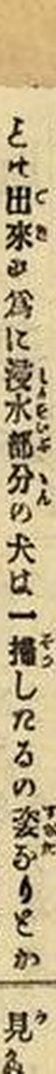ことの出來ず爲に浸水部分の犬は一掃したるの姿なりとか
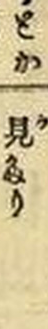見たり
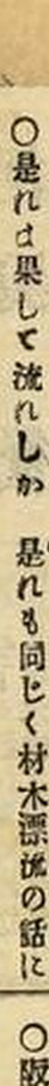○是れは果して流れしか是れも同じく材木漂流の話に
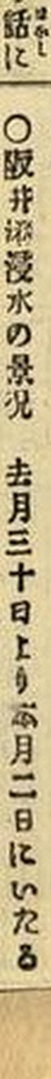○阪井港浸水の景況去月三十日より本月二日にいたる
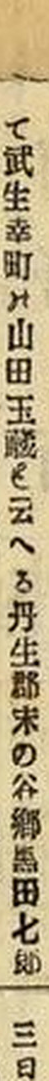て武生幸町の山田玉藏と云へる丹生郡末の谷郷黒田七郎
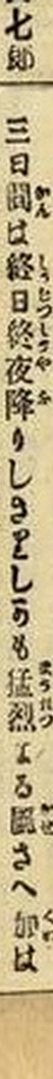三日間は終日終夜降りしきりしかも猛烈なる風さへ加は
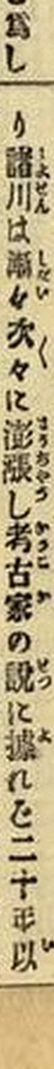り諸川は漸々次々に澎漲し考古家の説に據れば二十年以
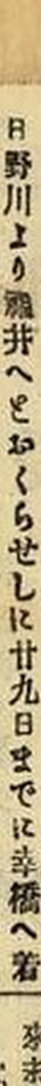日野川より福井へとおくらせしに廿九日までに幸橋へ着
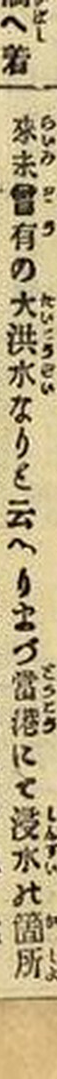來未曾有の大洪水なりと云へりまづ當港にて浸水の箇所
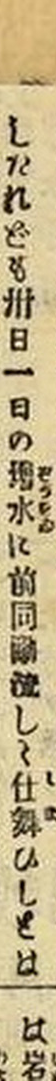したれども卅日一日の增水に前同斷流して仕舞ひしとは
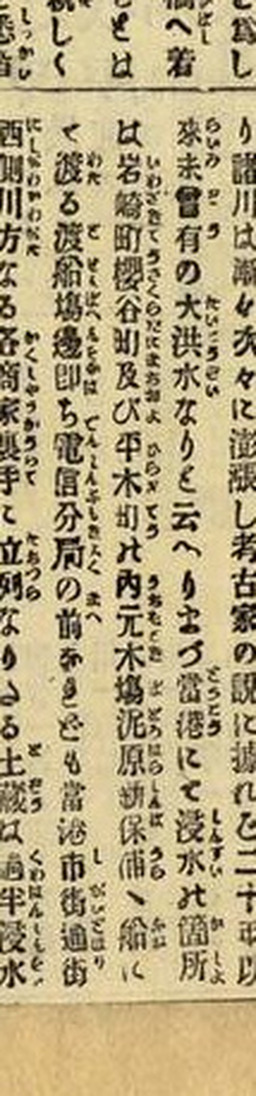は岩崎町櫻谷町及び平木町の内元木塲泥原新保浦へ船に
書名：温古集 五巻
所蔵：福井県文書館 Fukui Prefectural Archives
